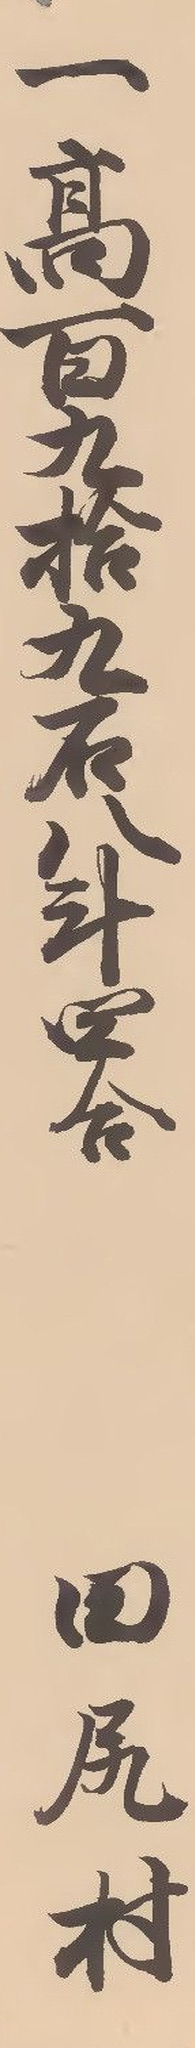一高百九拾九石八斗四合田尻村
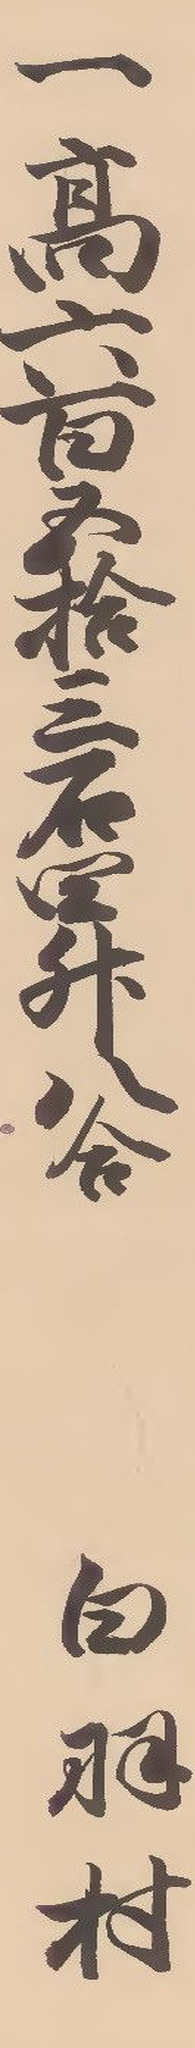一高六百五拾三石四升八合白羽村

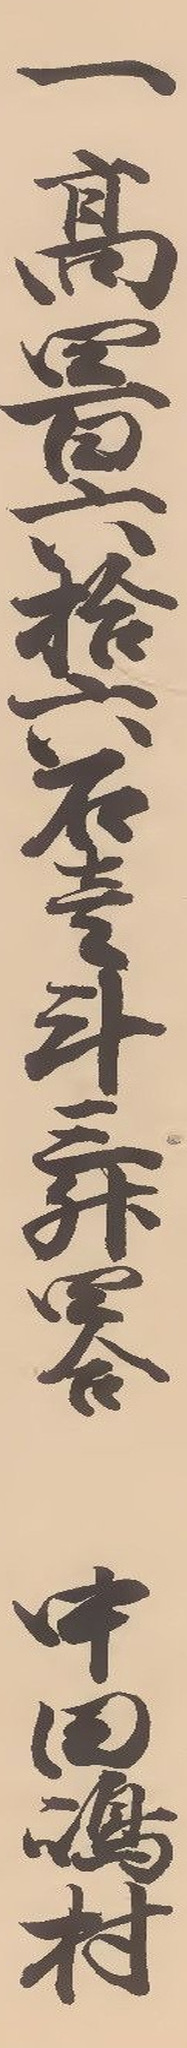一高四百六拾六石壱斗三升四合中田島村
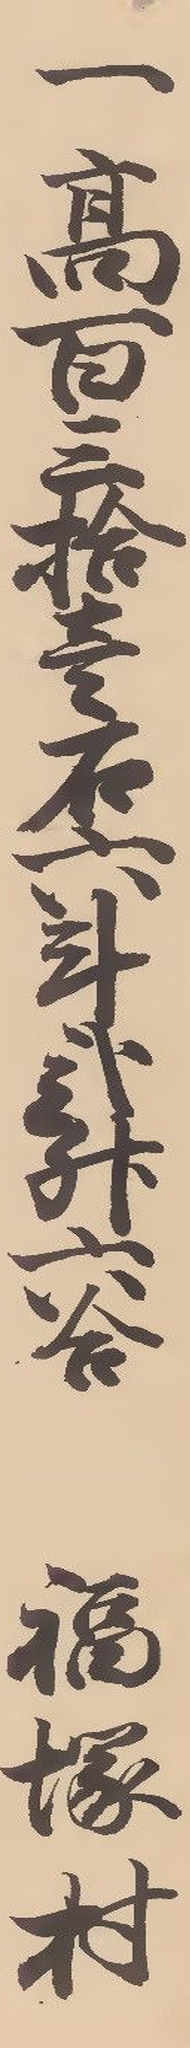一高百三拾壱石六斗弐升六合福塚村
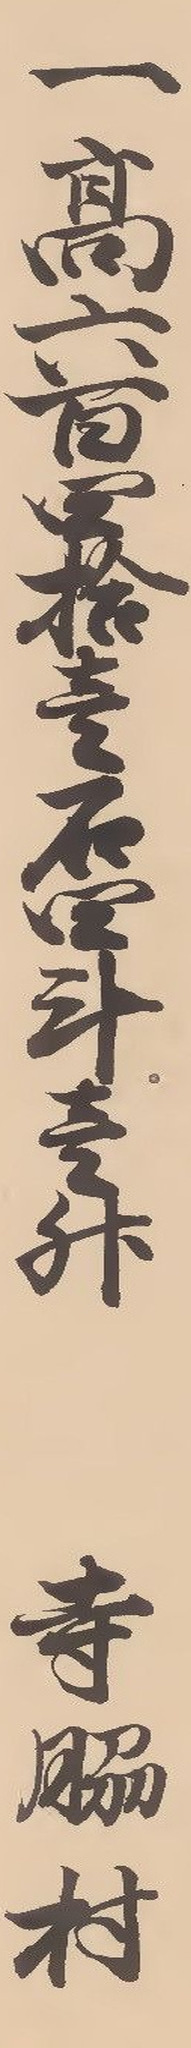一高六百四拾壱石四斗壱升寺脇村
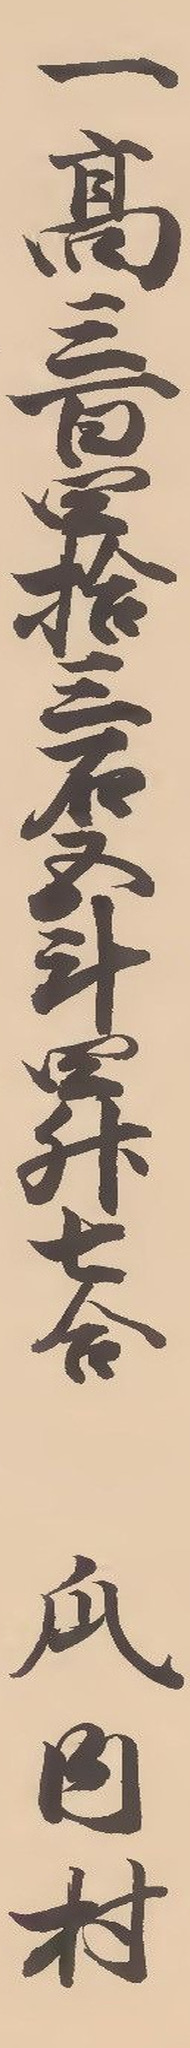一高三百四拾三石五斗四升七合瓜内村
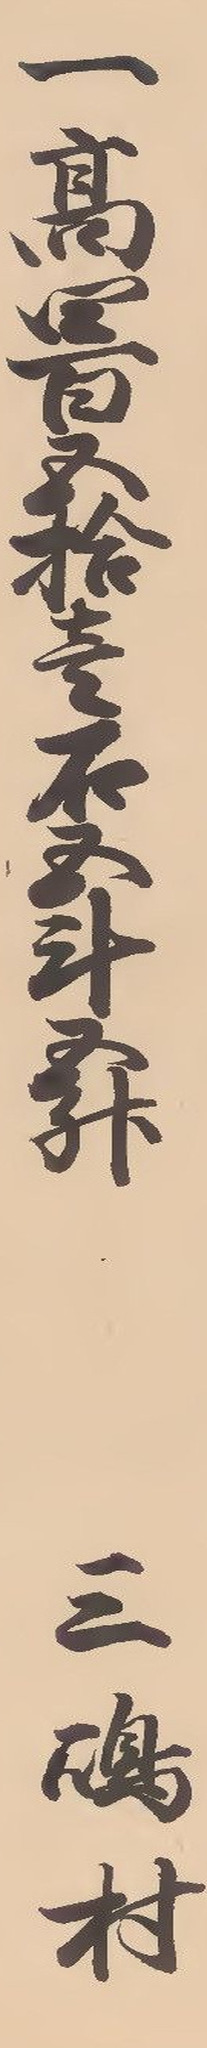一高四百五拾壱石五斗五升三島村
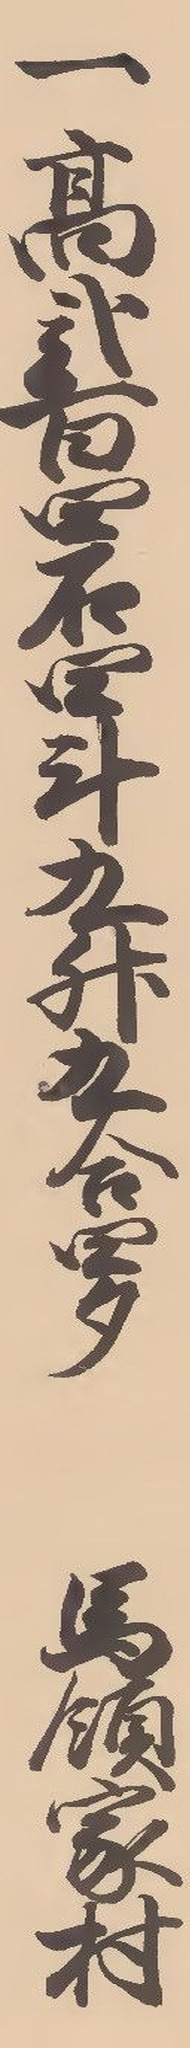一高弐百四石四斗九升九合四勺馬領家村
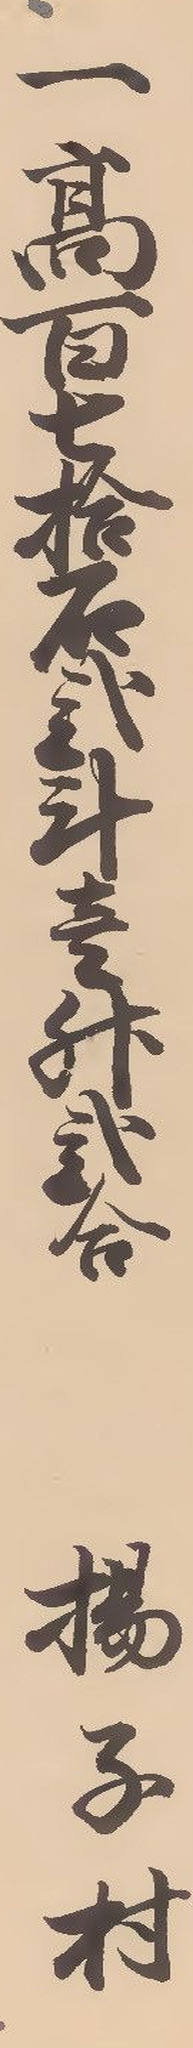一高百七拾石弐斗壱升弐合揚子村
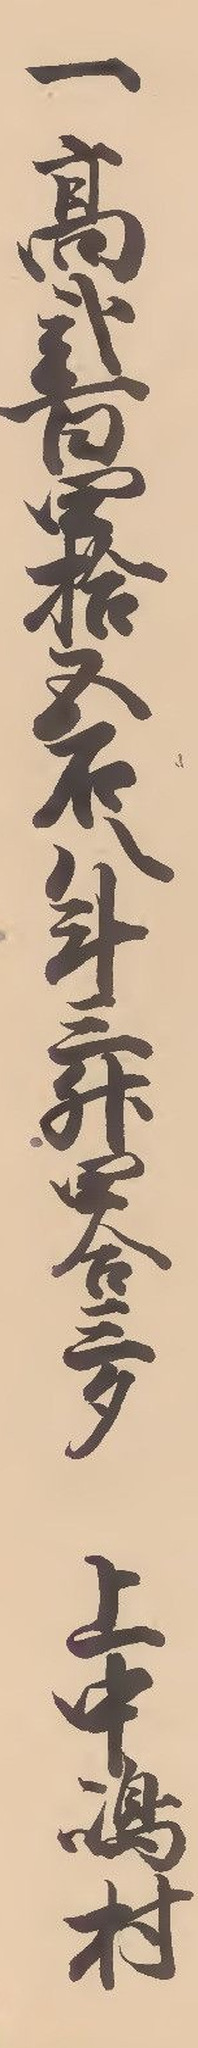一高弐百四拾五石八斗三升四合三勺上中島村

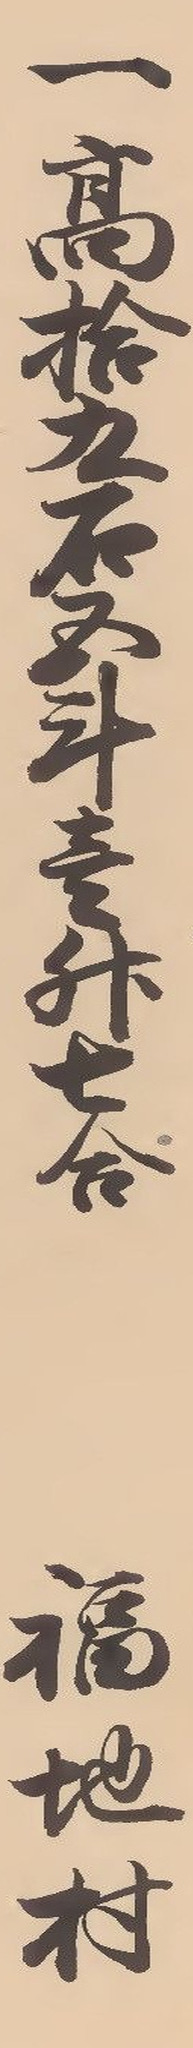一高拾九石五斗壱升七合福地村
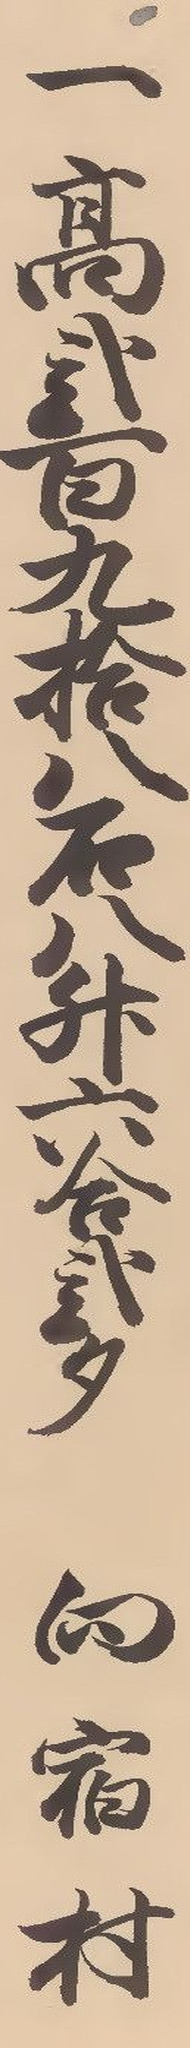一高弐百九拾八石八升六合弐勺向宿村
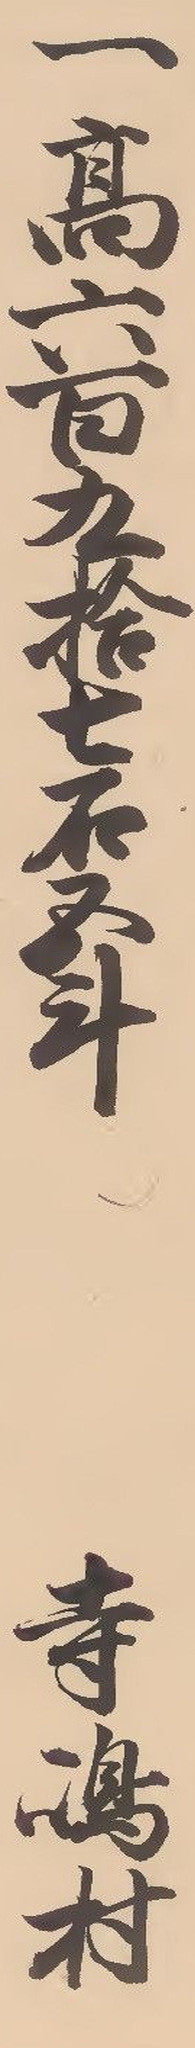一高六百九拾七石五斗寺島村
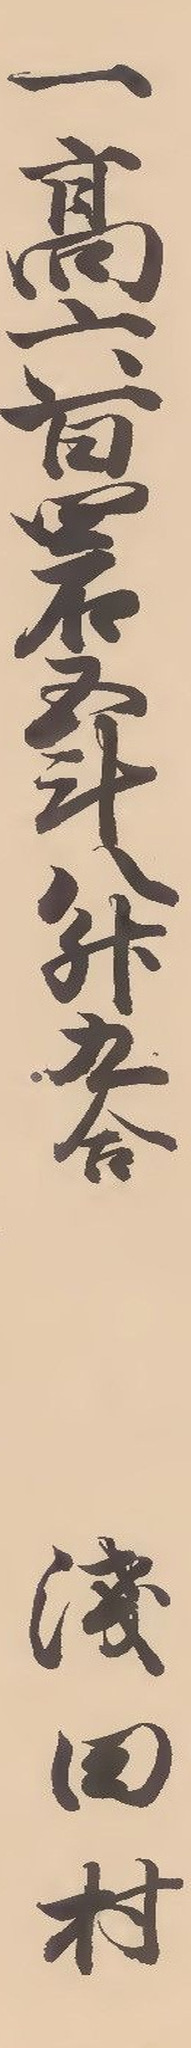一高六百四石五斗八升九合浅田村
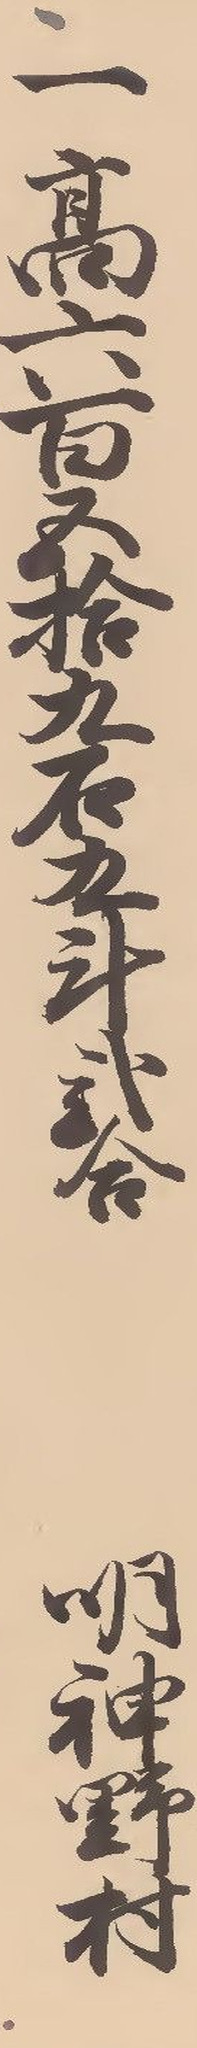一高六百五拾九石九斗弐合明神野村

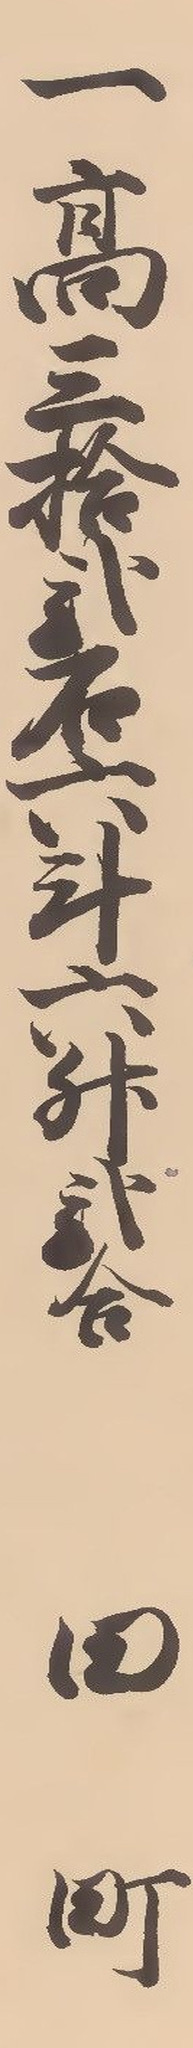一高三拾弐石六斗六升弐合田町
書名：遠江国郷帳
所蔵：国立公文書館 National Archives of Japan
